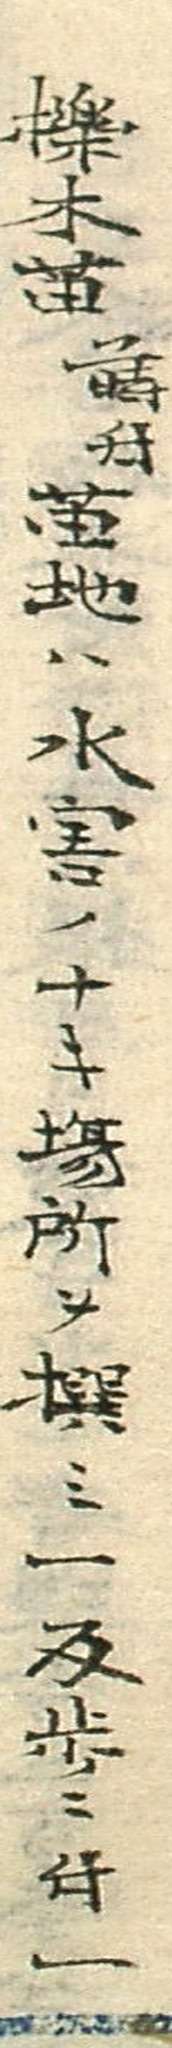櫟木苗蒔付苗地ハ水害ノナキ場所ヲ撰ミ一反歩ニ付一
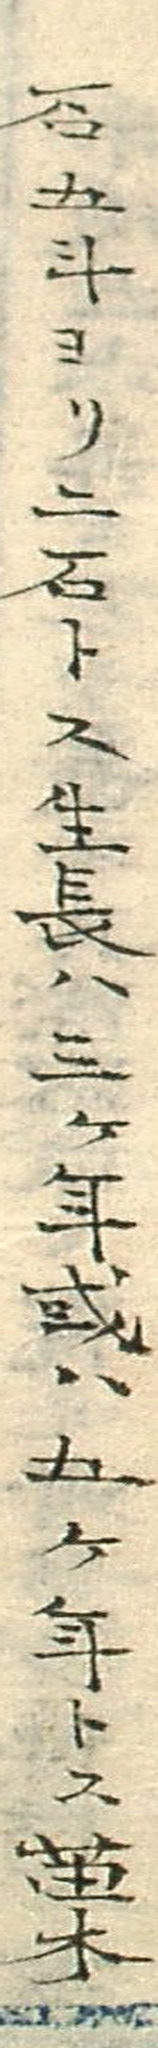石五斗ヨリ二石トス生長ハ三ヶ年或ハ五ヶ年トス苗木
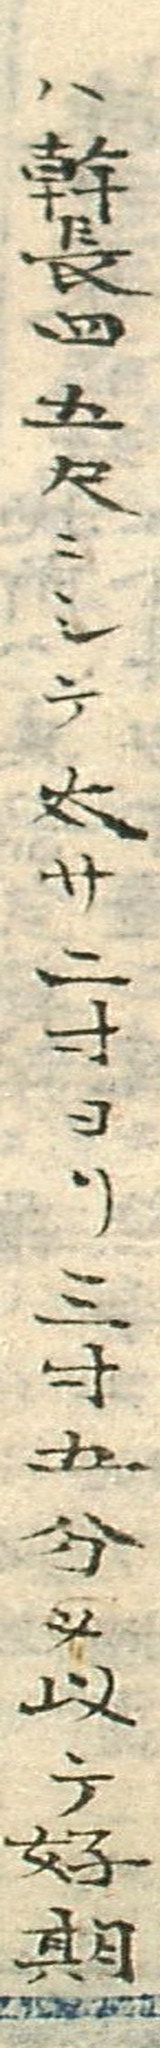ハ幹長四五尺ニシテ太サ二寸ヨリ三寸五分ヲ以テ好期
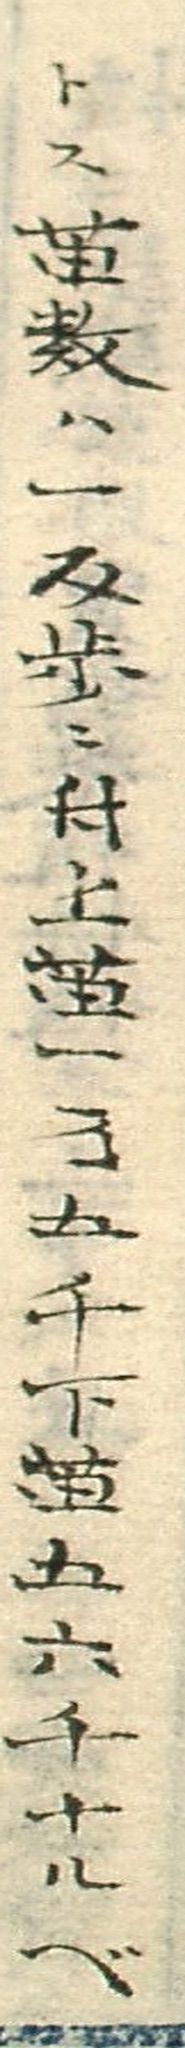トス苗数ハ一反歩ニ付上苗一万五千下苗五六千ナルベ
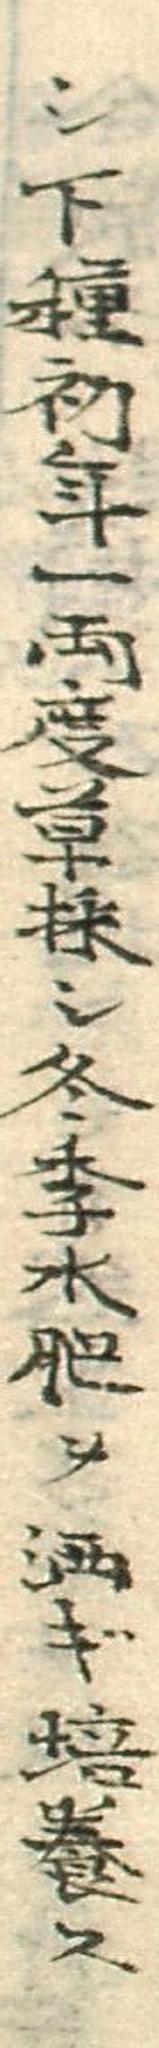シ下種初年一両度草採シ冬季水肥ヲ洒ギ培養ス
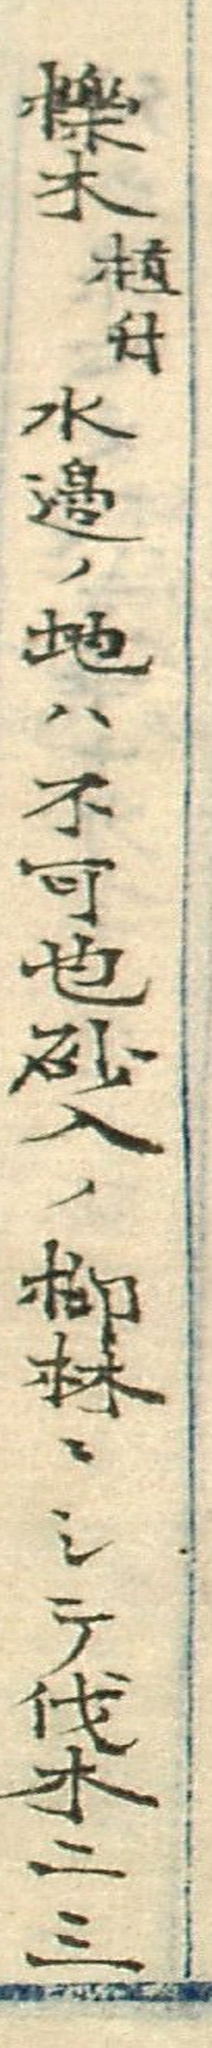櫟木植付水辺ノ地ハ不可也砂入ノ柳林ニシテ伐木二三
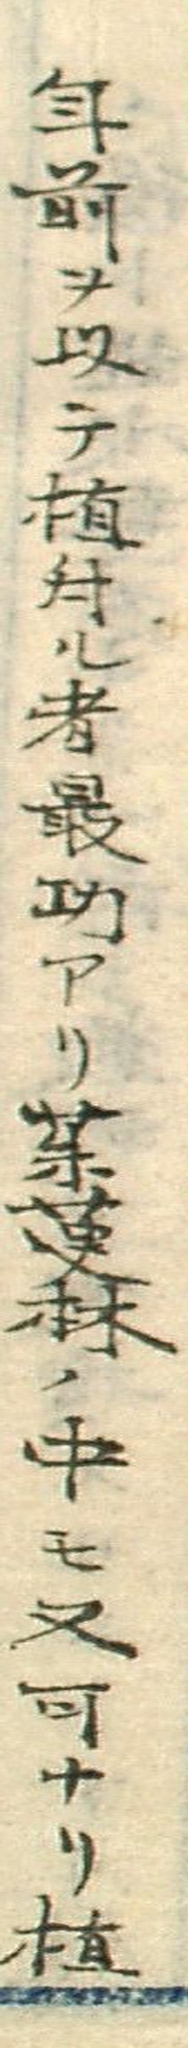年前ヲ以テ植付ル者最功アリ茱萸林ノ中モ又可ナリ植
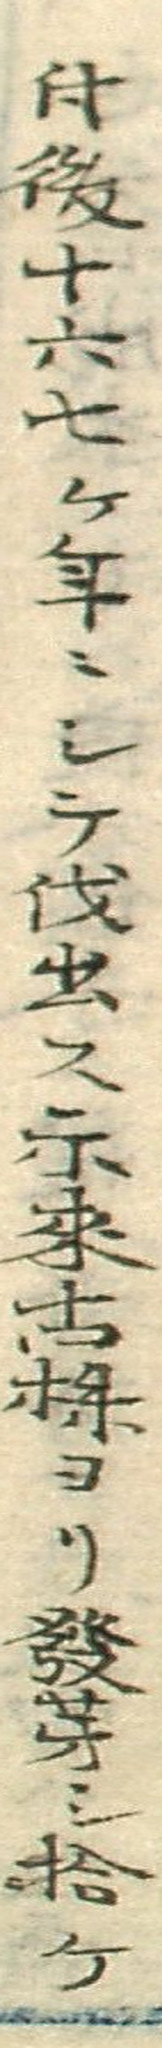付後十六七ヶ年ニシテ伐出ス示来古株ヨリ発芽シ拾ヶ
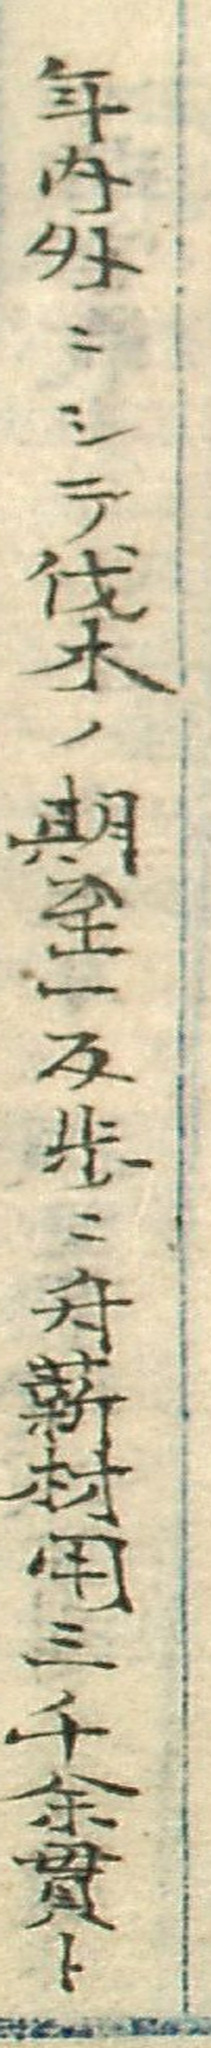年内外ニシテ伐木ノ期至一反歩ニ付薪材用三千余貫ト

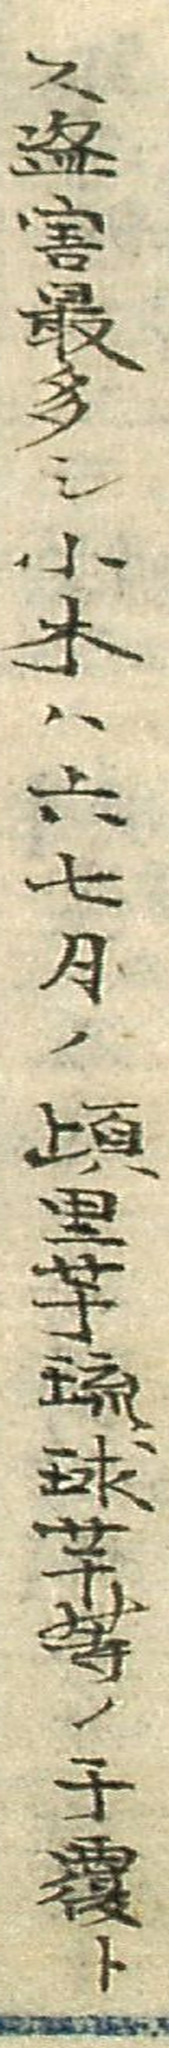ス盗害最多シ小木ハ六七月ノ頃里芋琉球芋等ノ干覆ト
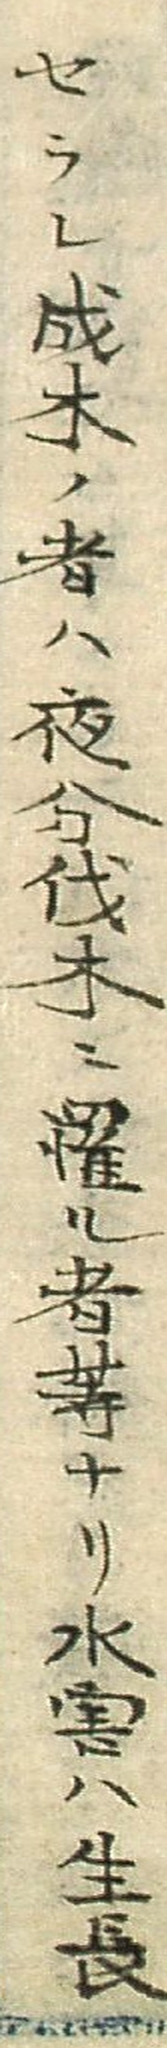セラレ成木ノ者ハ夜分伐木ニ罹ル者等ナリ水害ハ生長
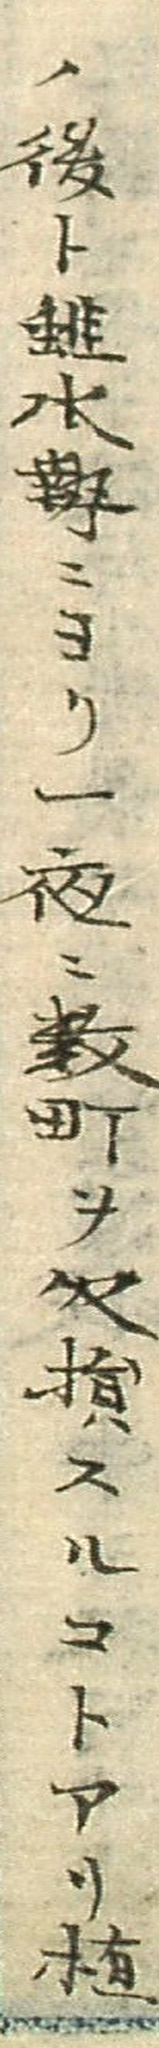ノ後ト雖水勢ニヨリ一夜ニ数町ヲ欠損スルコトアリ植
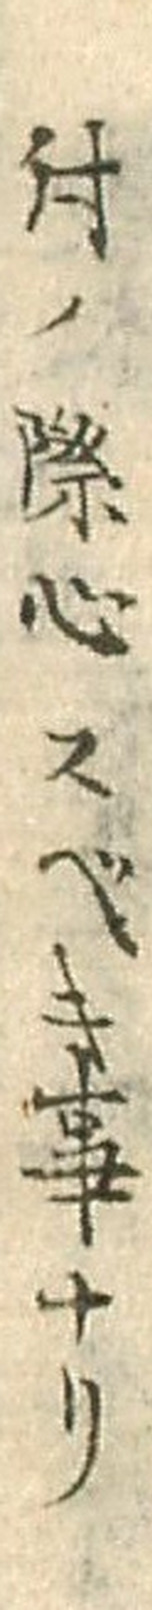付ノ際心スベキ事ナリ
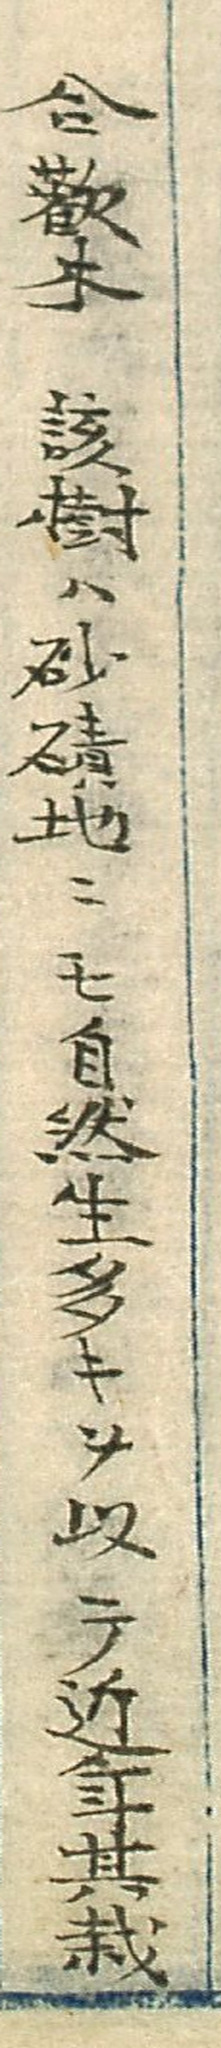合歓木該樹ハ砂磧地ニモ自然生多キヲ以テ近年其栽
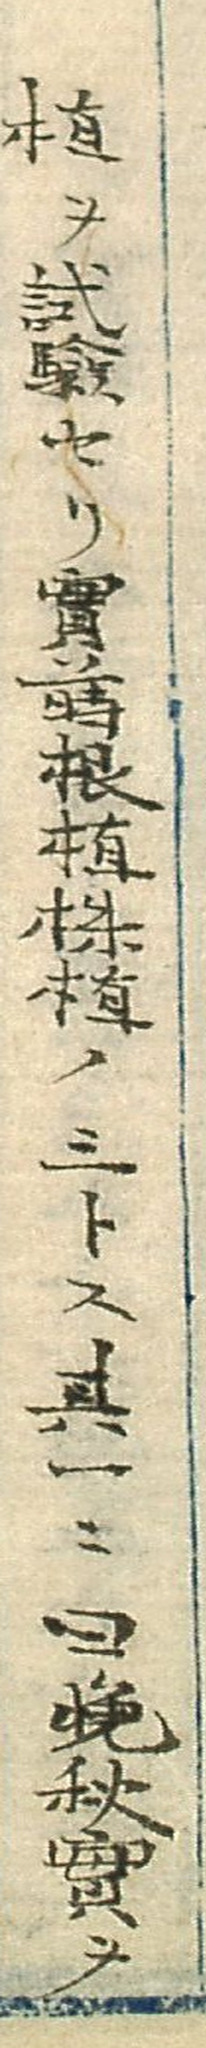植ヲ試験セリ実蒔根植株植ノ三トス其一ニ曰晩秋実ヲ
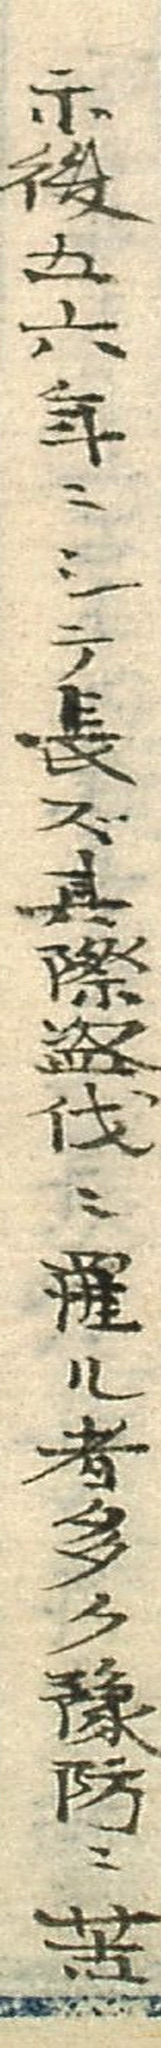示後五六年ニシテ長ズ其際盗伐ニ罹ル者多ク予防ニ苦
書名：山林共進会取調書
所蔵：鳴門教育大学 Naruto University of Education
